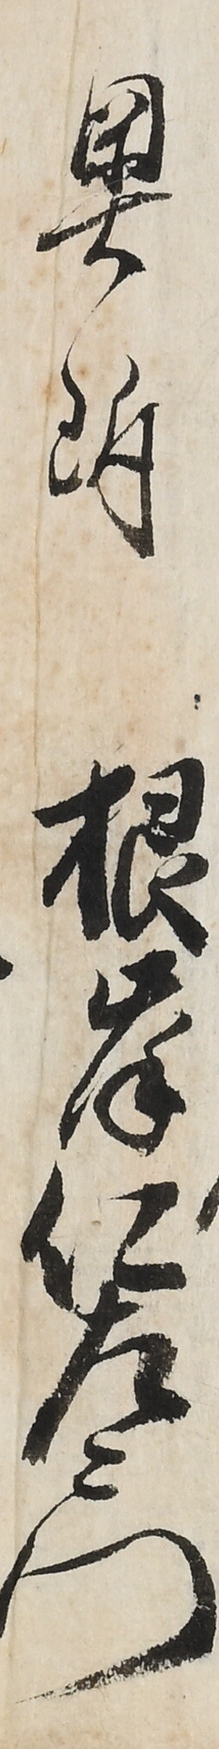奥付根岸仁左衛門
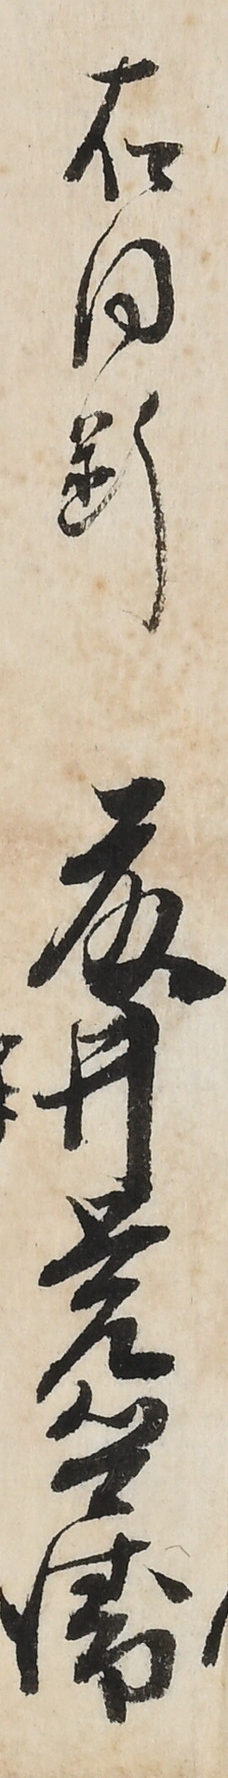右同断藤井覚兵衛
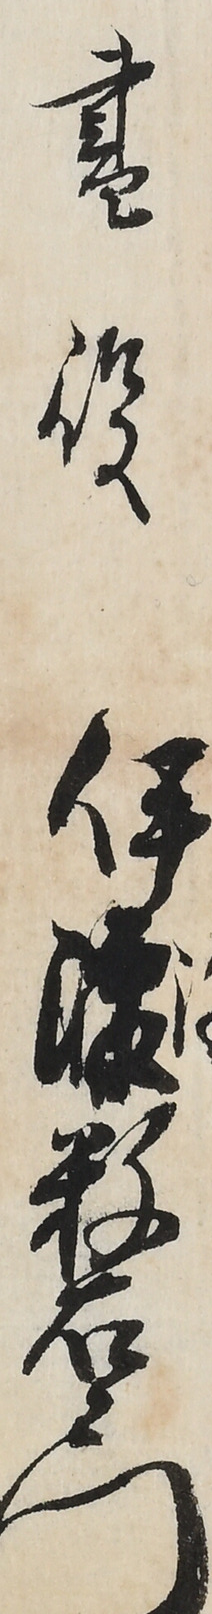書役伊澤数右衛門
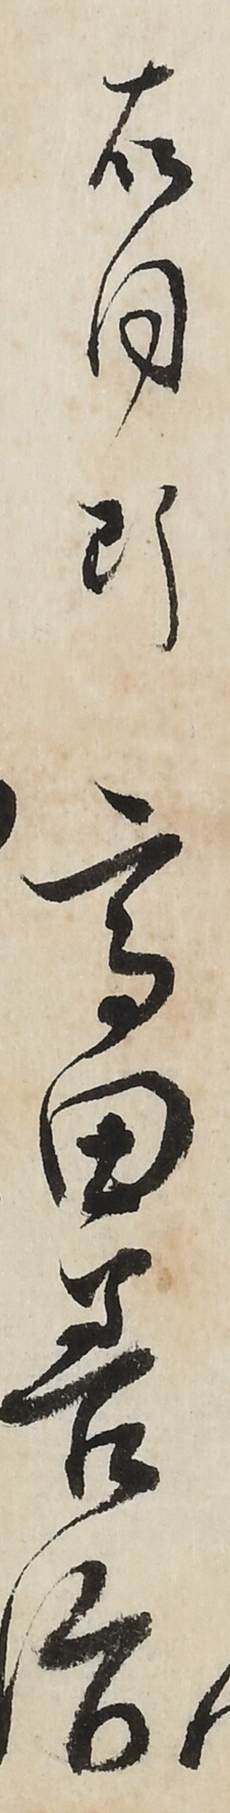右同断高田善治
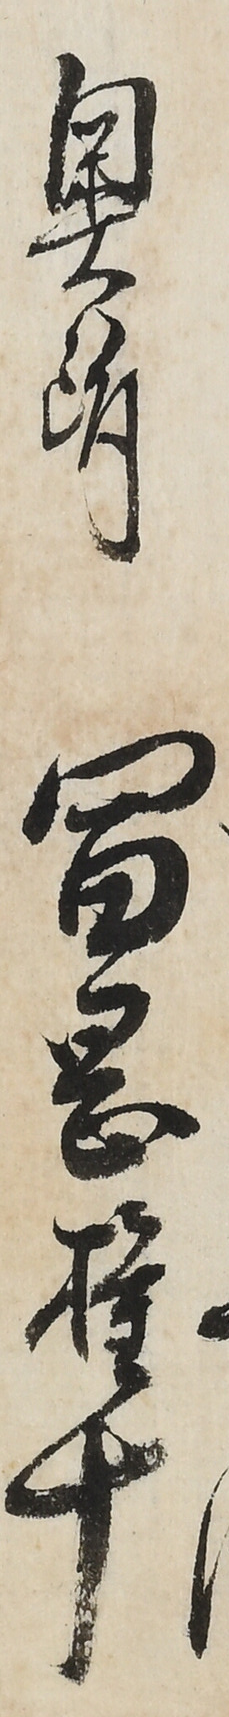奥付富岡権十
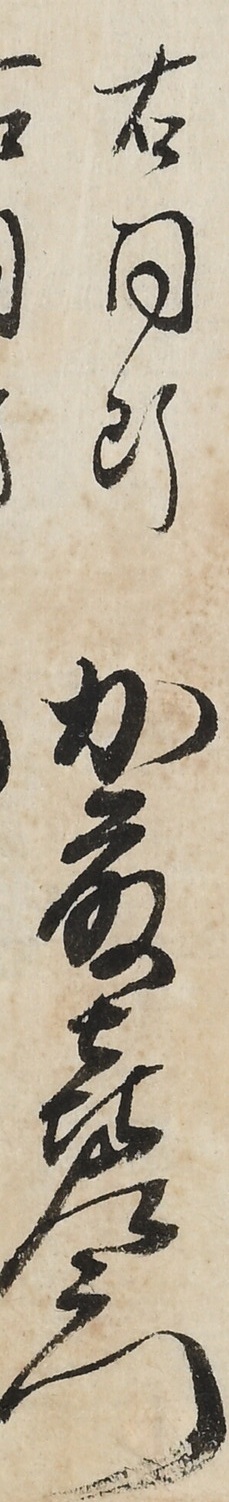右同断加藤喜左衛門
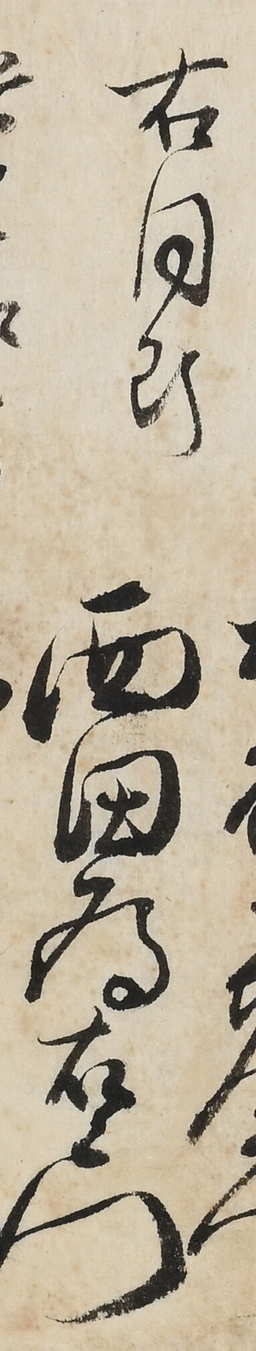右同断西田為右衛門
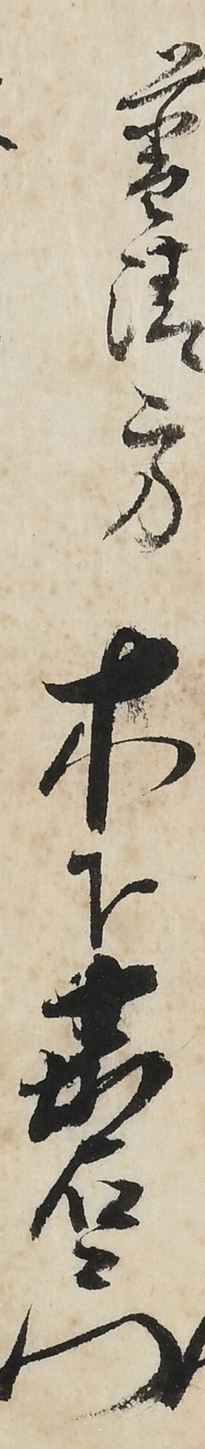普請方木下嘉右衛門
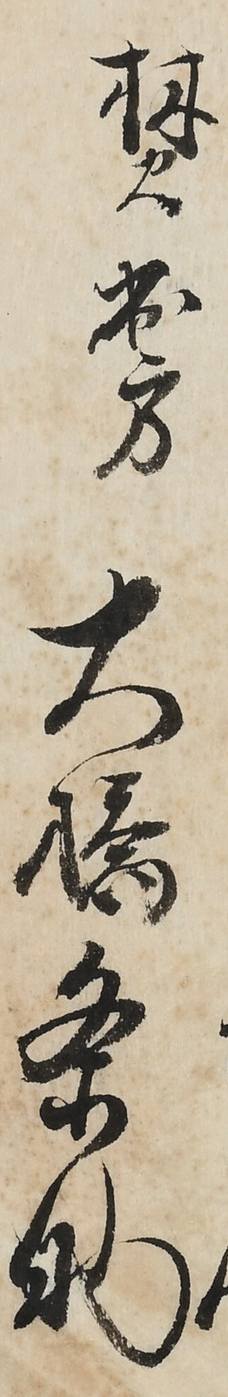焚出方大橋条助

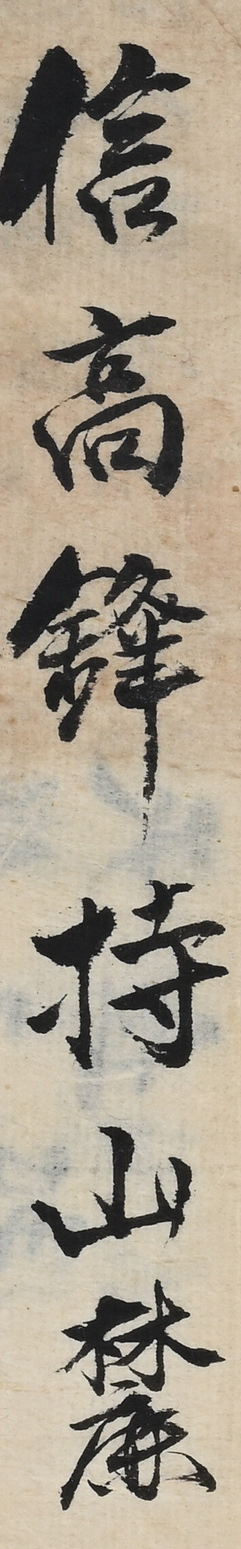信高鋒持山麓
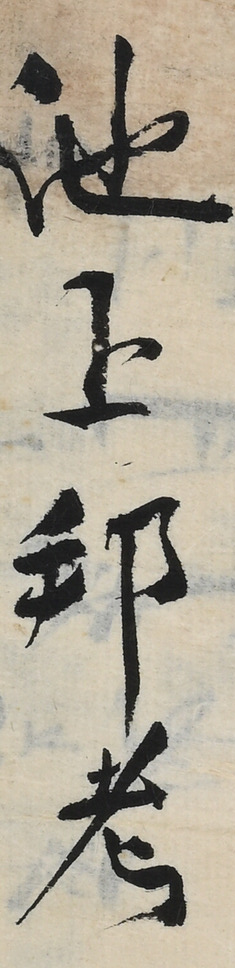池上邦考
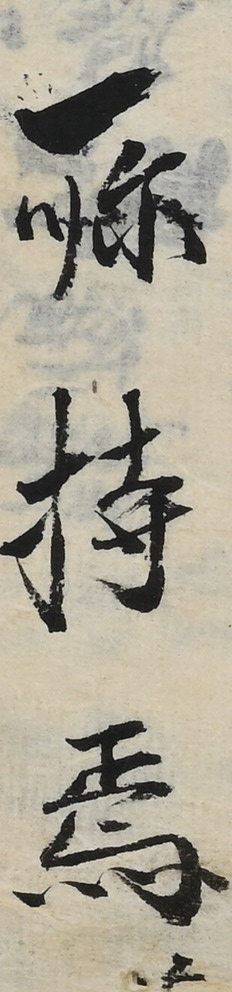所持焉
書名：高遠江戸徒以上之面々
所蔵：伊那市立高遠町図書館・合同会社AMANE
